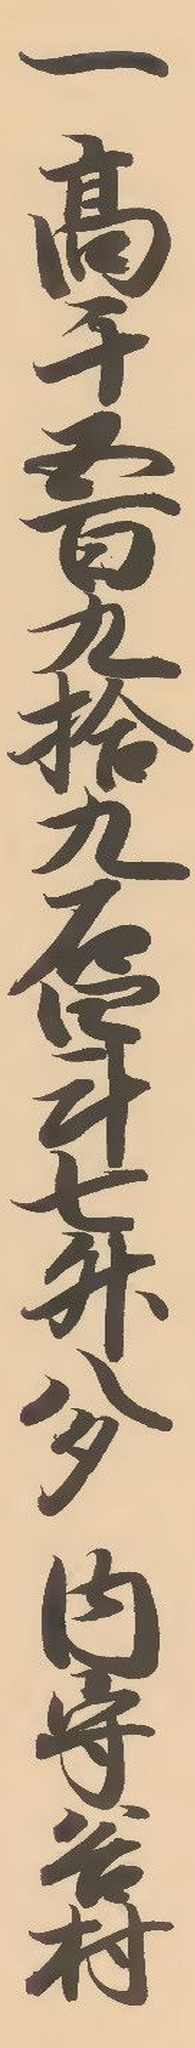一高千五百九拾九石四斗七升八勺内守谷村

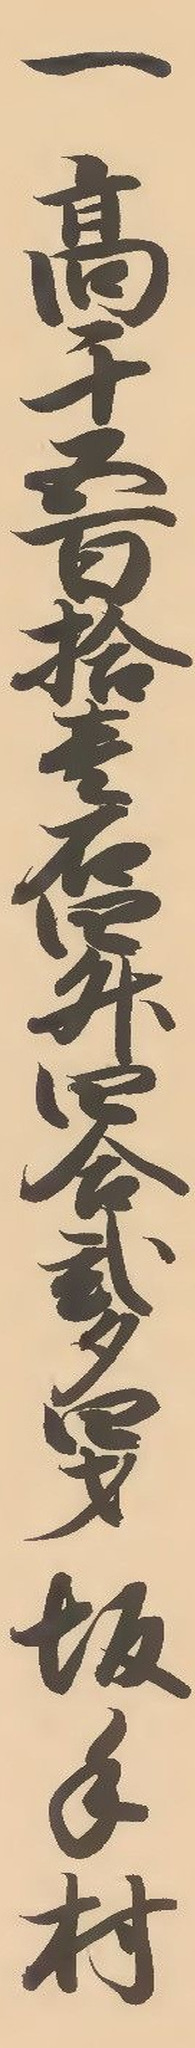一高千五百拾壱石四升四合弐勺四才坂手村
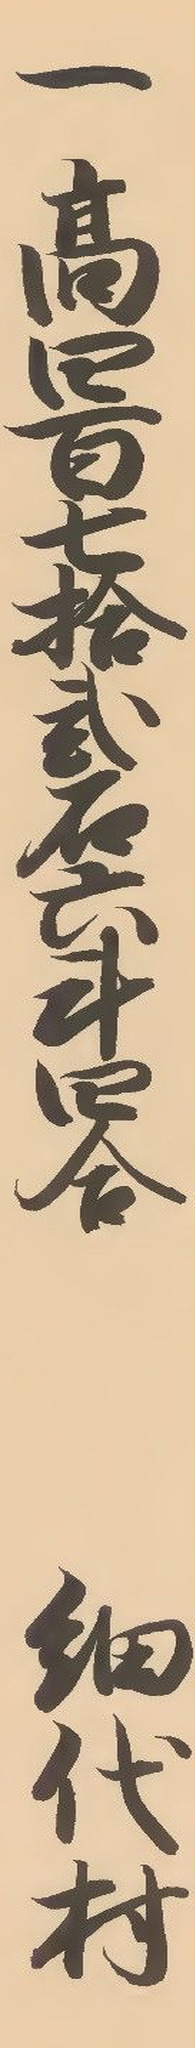一高四百七拾弐石六斗四合細代村
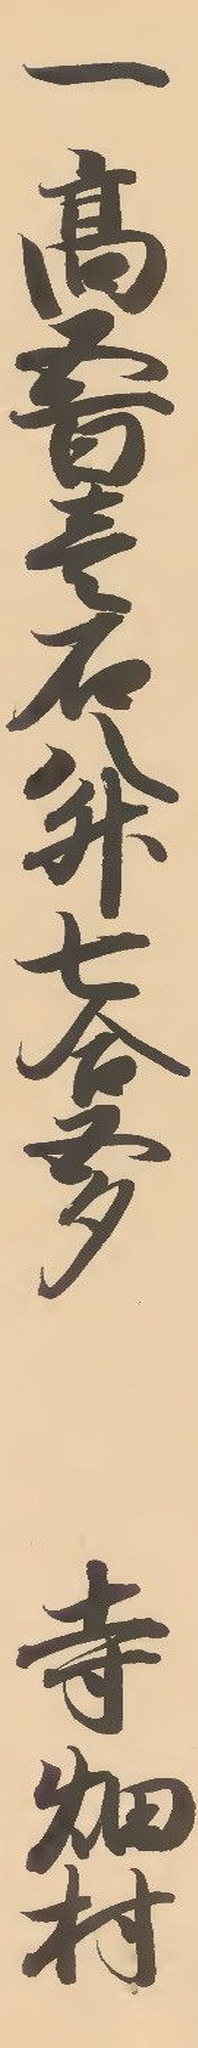一高五百壱石八升七合五勺寺畑村
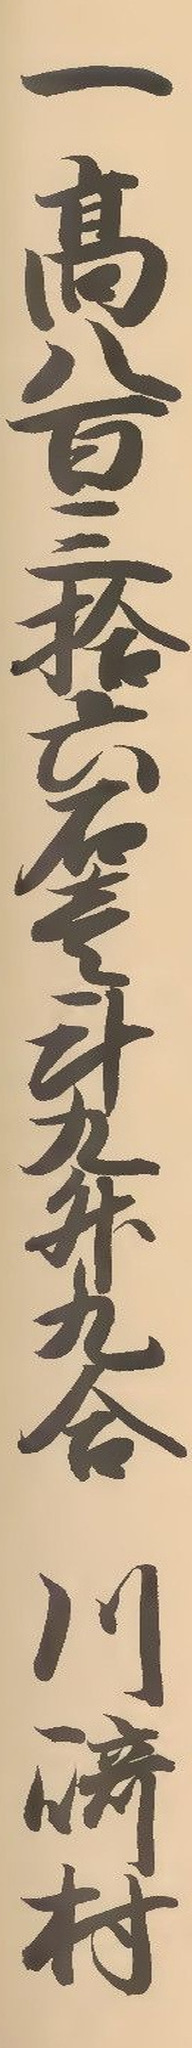一高八百三拾六石壱斗九升九合川崎村
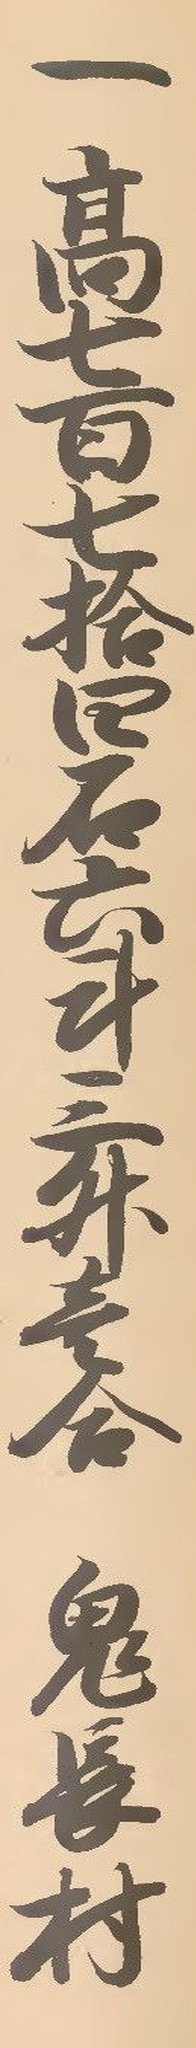一高七百七拾四石六斗三升壱合鬼長村
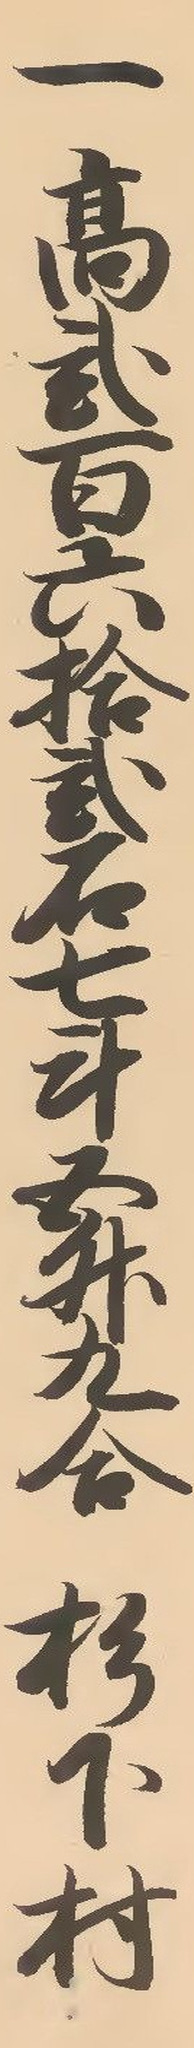一高弐百六拾弐石七斗五升九合杉下村
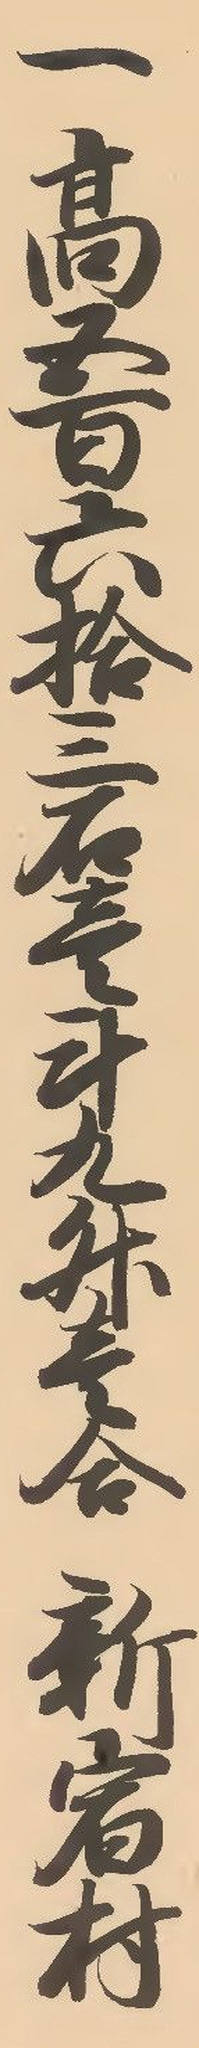一高五百六拾三石壱斗九升壱合新宿村
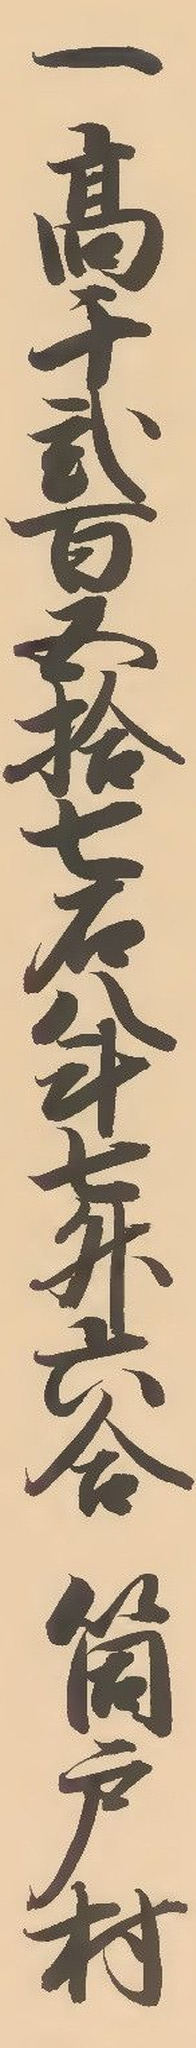一高千弐百五拾七石八斗七升六合筒戸村

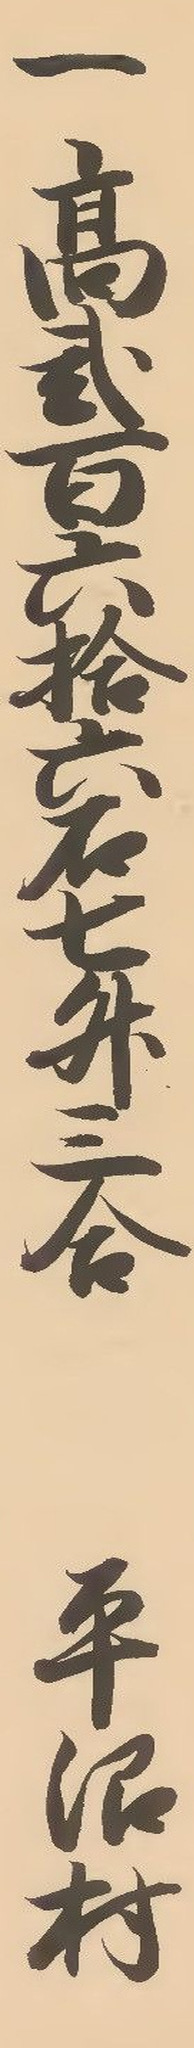一高弐百六拾六石七升三合平沼村
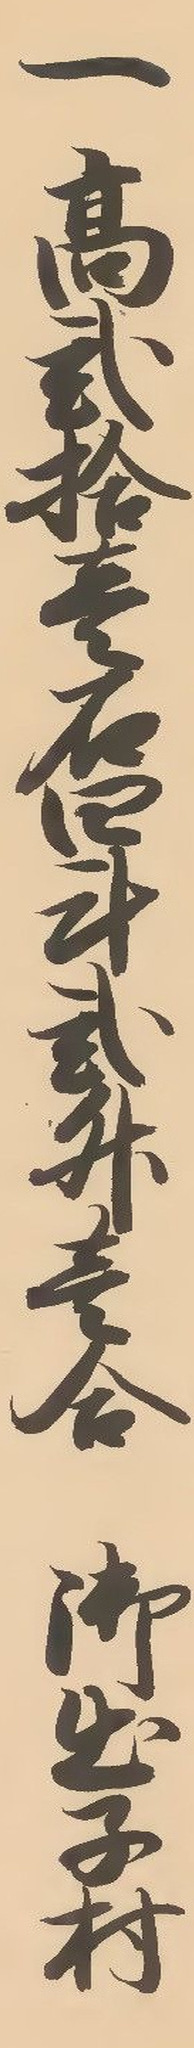一高弐拾壱石四斗弐升壱合御出子村
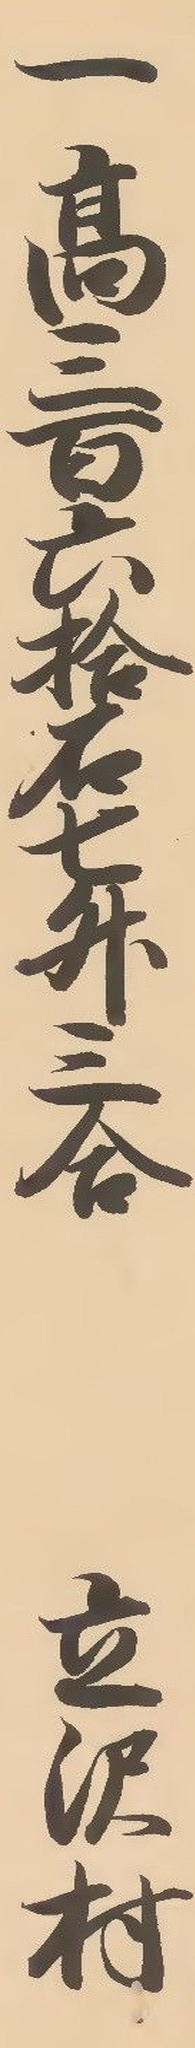一高三百六拾石七升三合立沢村
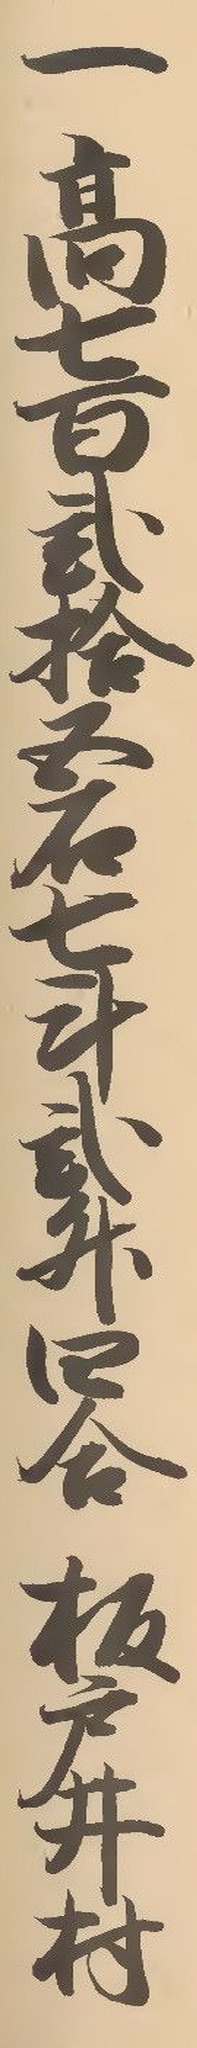一高七百弐拾五石七斗弐升四合板戸井村
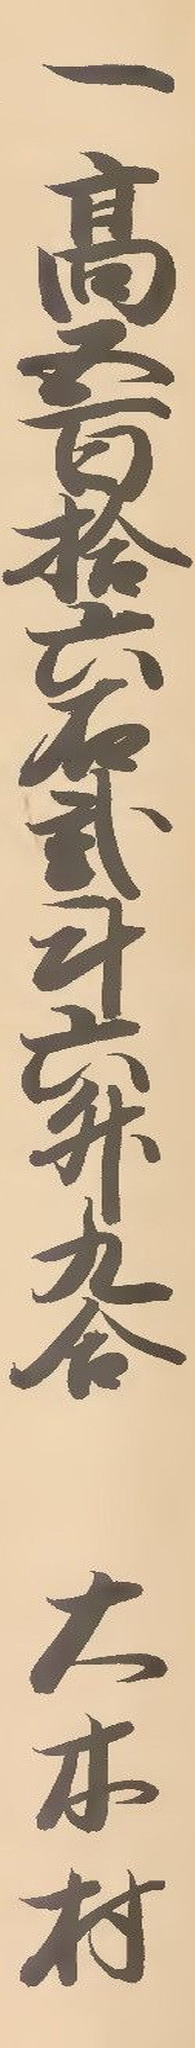一高五百拾六石弐斗六升九合大木村
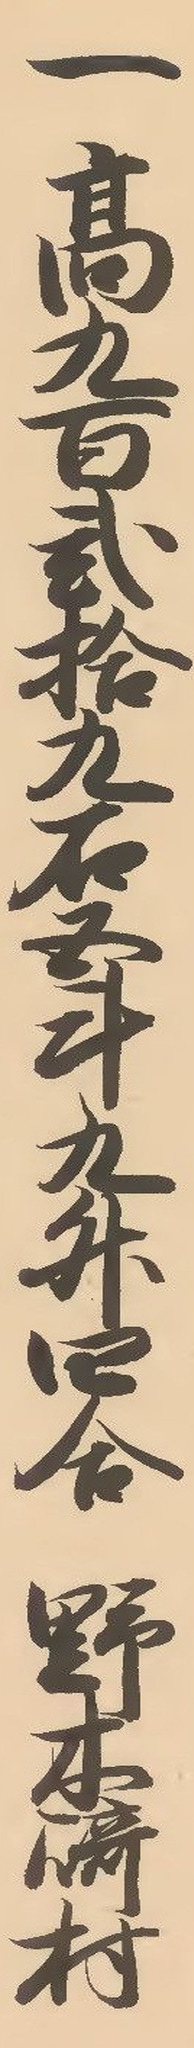一高九百弐拾九石五斗九升四合野木崎村
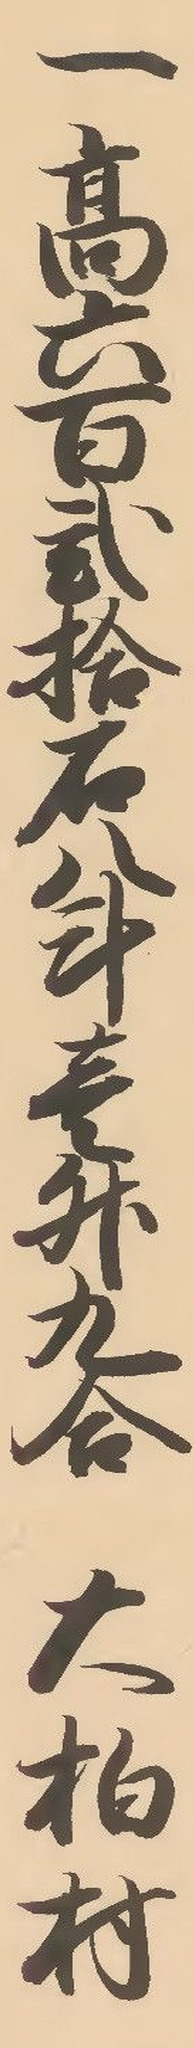一高六百弐拾石八斗壱升九合大柏村
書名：下総国郷帳
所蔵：国立公文書館 National Archives of Japan
